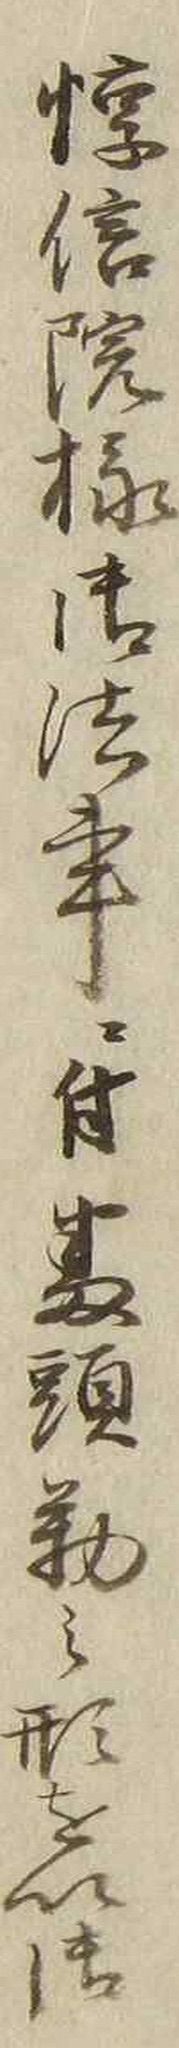惇信院様御法事に付番頭勤之形を以御

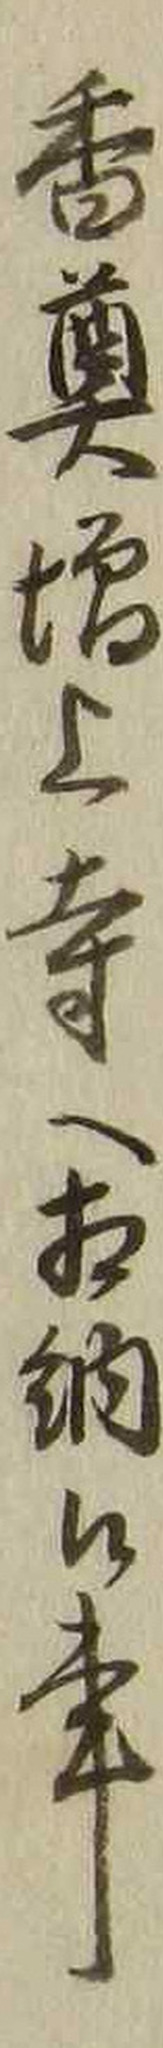香奠増上寺へ相納候事
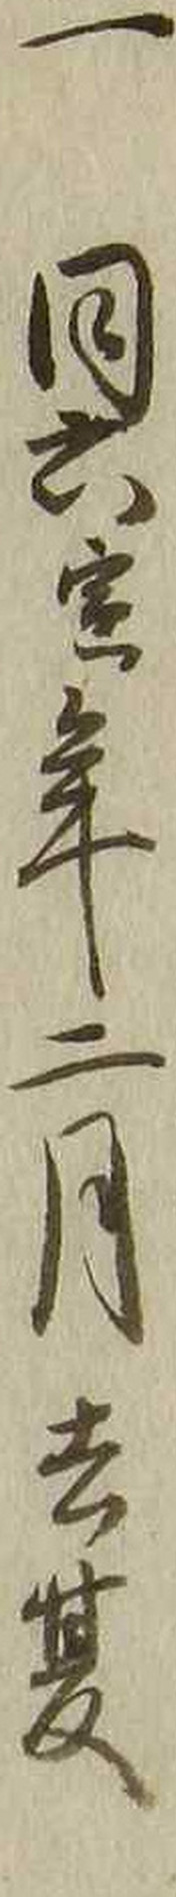一同六寅年二月去夏
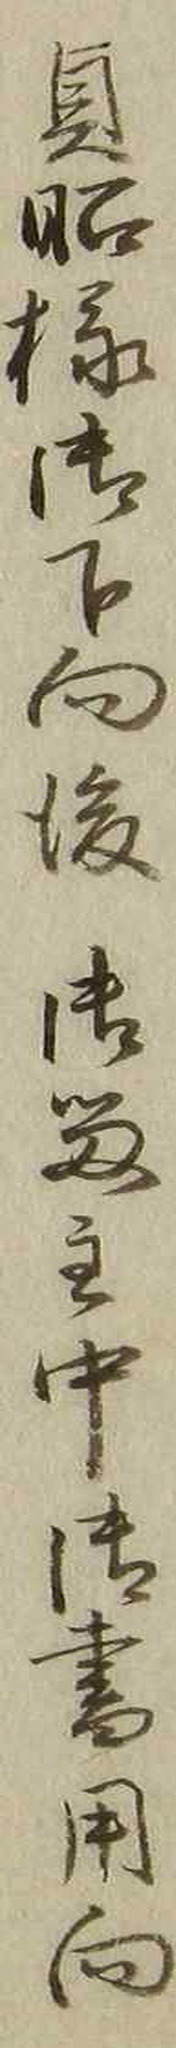貞昭様御下向後御留主中御書用向
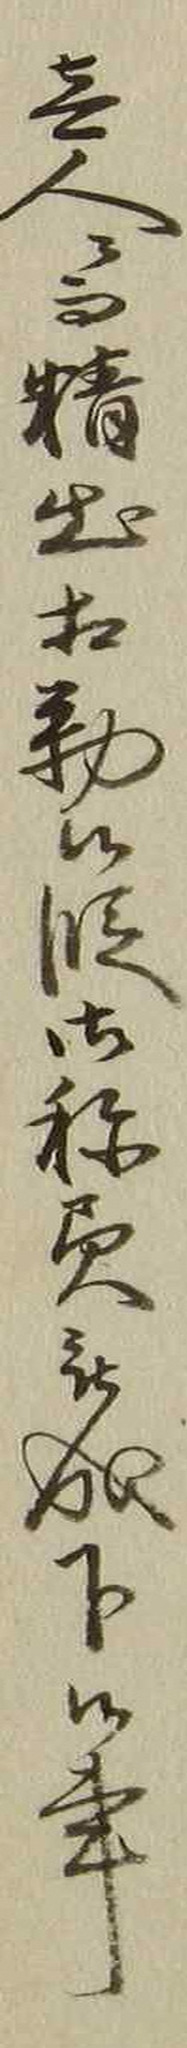壱人に而精出相勤候段御称美被成下候事
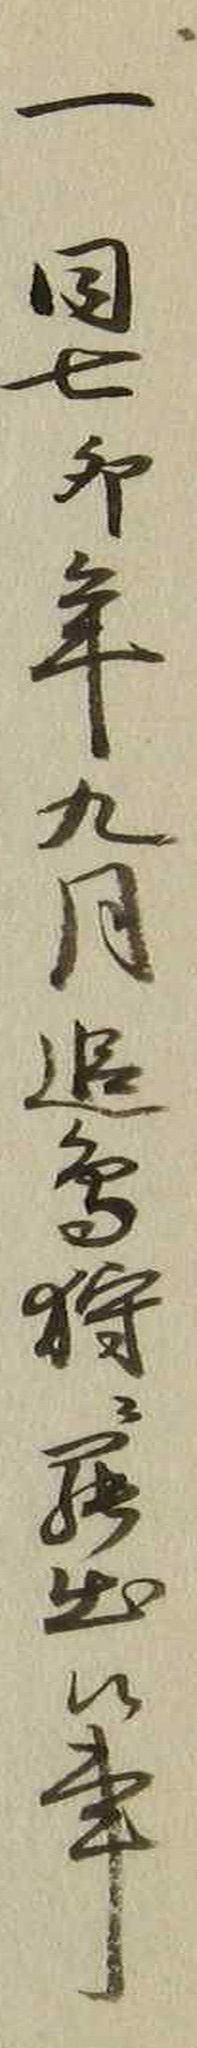一同七卯年九月追鳥狩に罷出候事
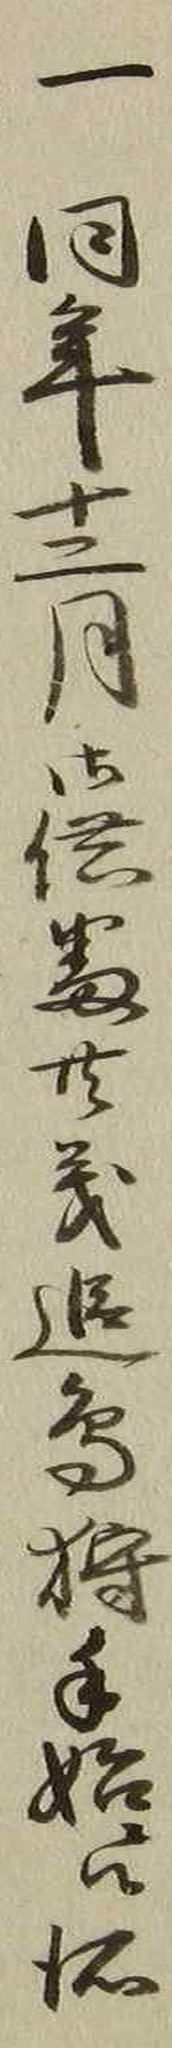一同年十二月御供番共義追鳥狩手始に候所
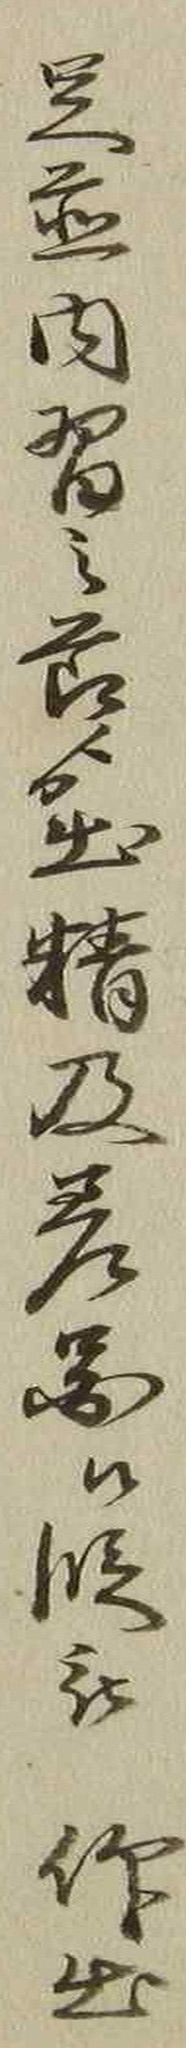足並内習之節ゟ出精及差図候段被仰出
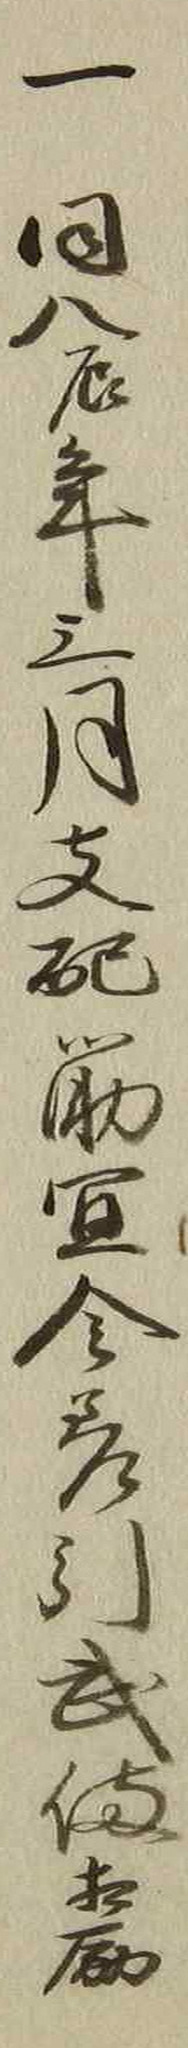一同八辰年三月支配筋宜令差引武備相励
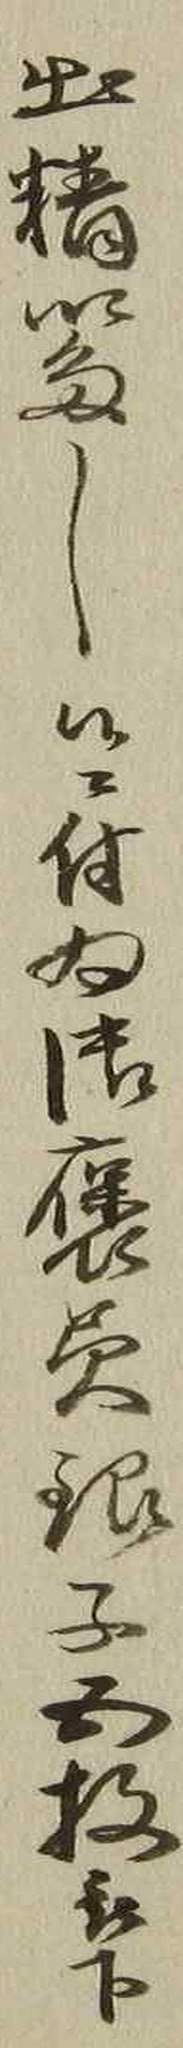出精いたし候に付為御褒美銀子五枚被下
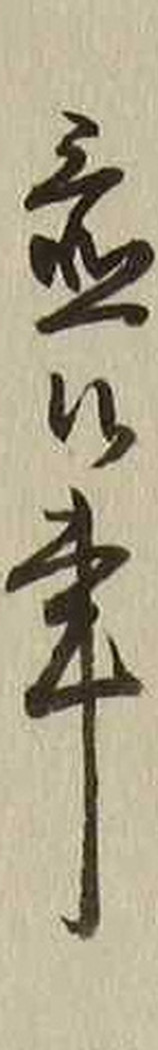置候事
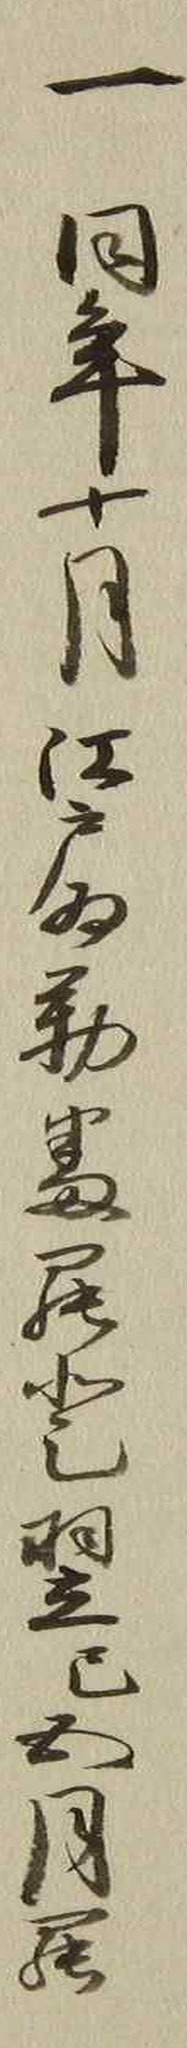一同年十月江戸為勤番罷登翌巳五月罷
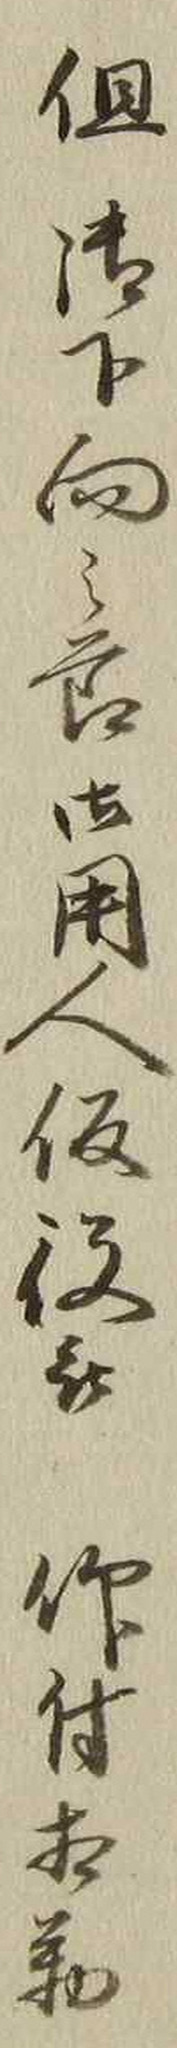但御下向之節御用人仮役被仰付相勤
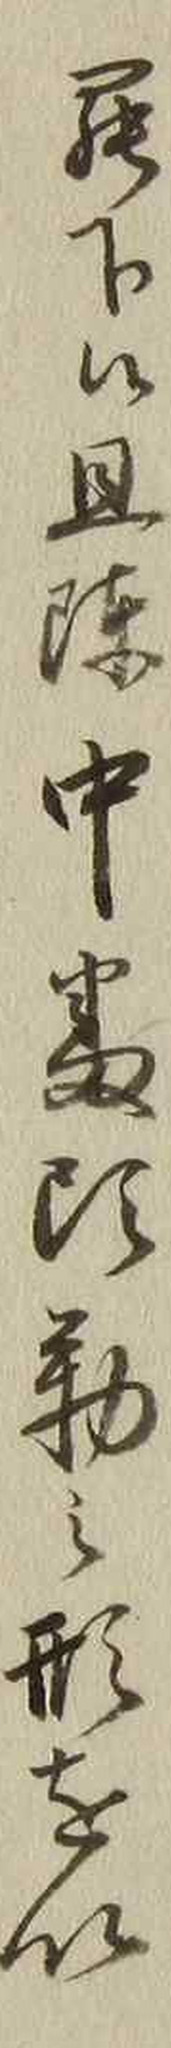罷下候且陣中番頭勤之形を以
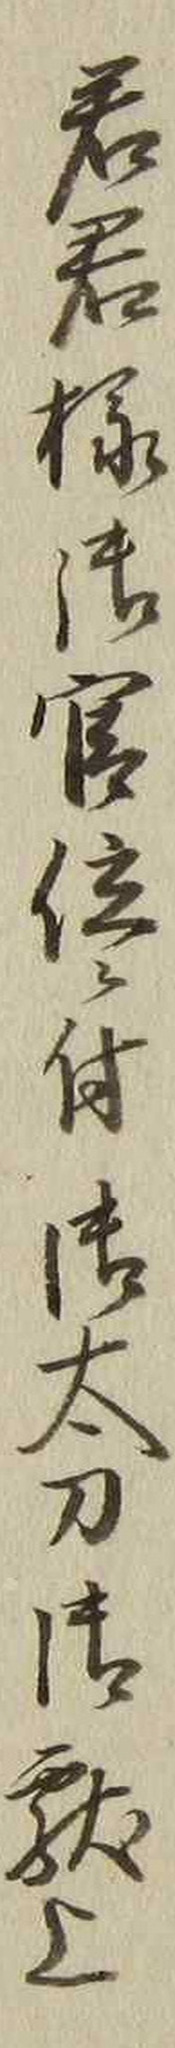若君様御官位に付御太刀御献上
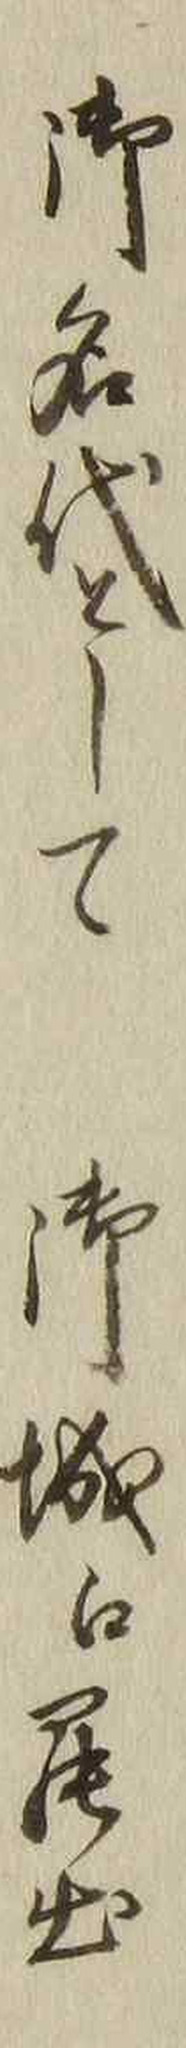御名代として御城江罷出
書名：諸士系譜　巻之133　た之部9
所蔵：会津若松市立会津図書館
